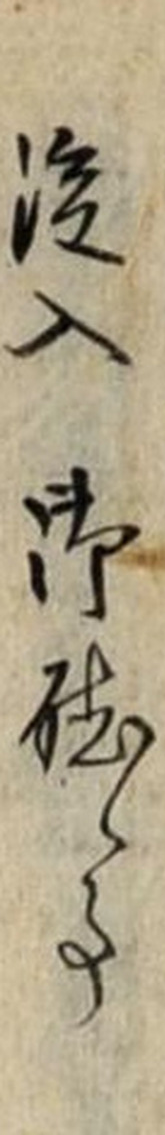後入御聴候事
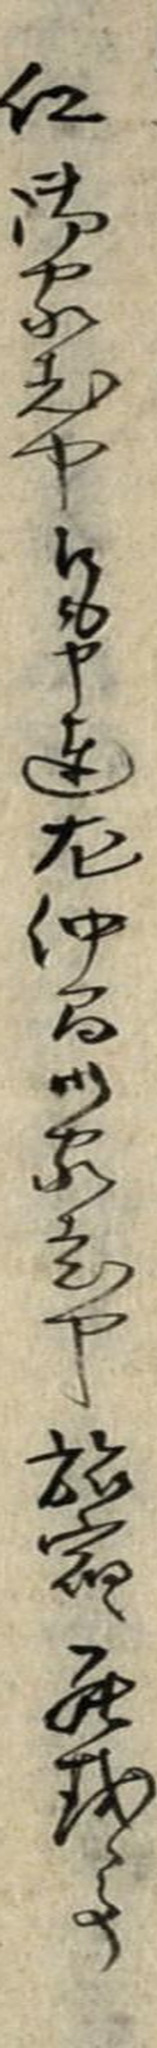但御家老中江も申達尤仲間御家老中旅宿へ罷越候事
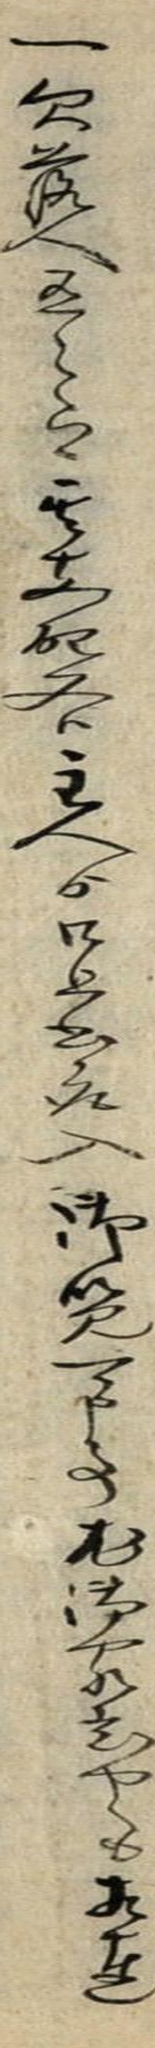一欠落人有之候はゝ其支配又は主人ゟ口上書取入御覧可申事尤御家老中へも相達
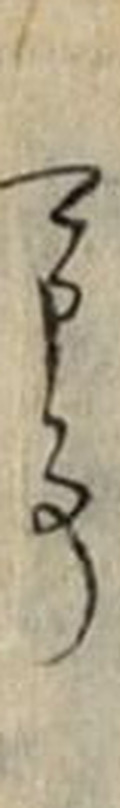可申事
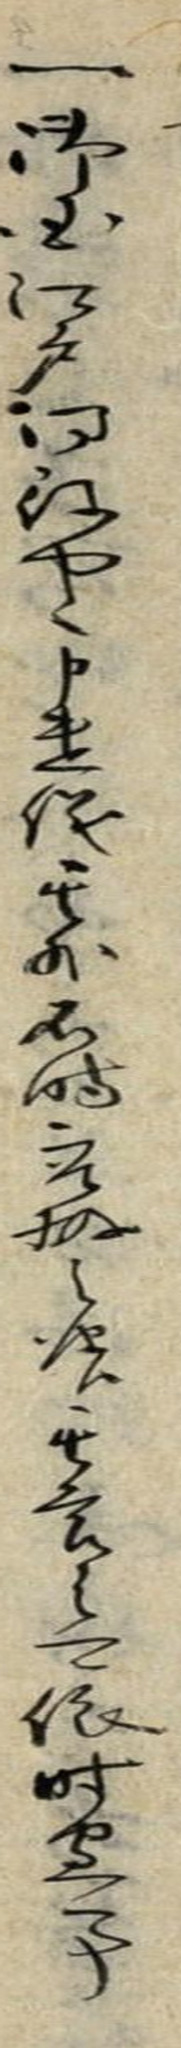一御国江戸同役中へ申遣儀其外不時取扱之儀は其節之可依時宜事
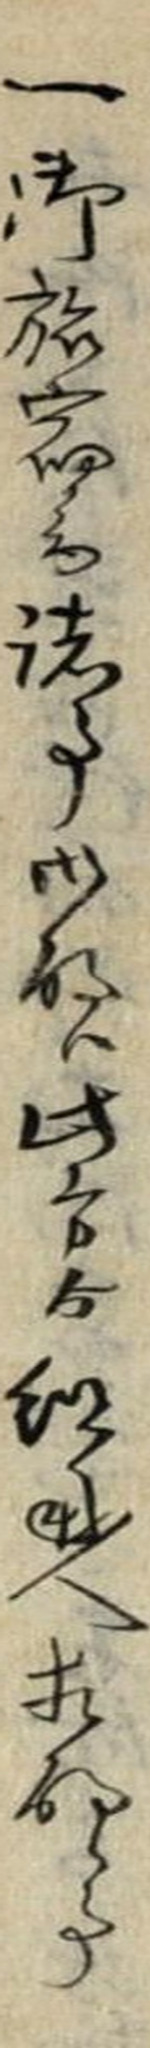一御旅宿にて諸事御触は此方ゟ組用人相触候事
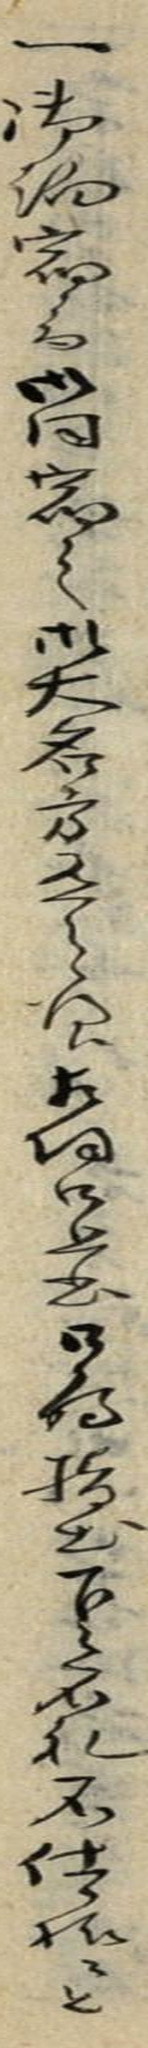一御泊宿にて御同宿之御大名方有之候得は相伺口上書御触指出下々不礼不仕候様にと
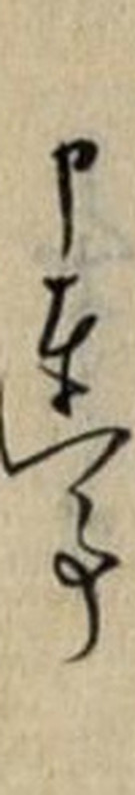申達事
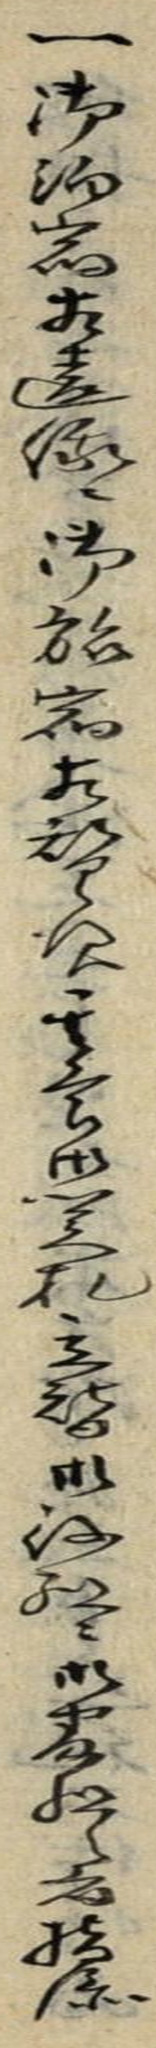一御泊宿相違俄に御旅宿相替候得は其節御関札立替御役組に御番組之者指添
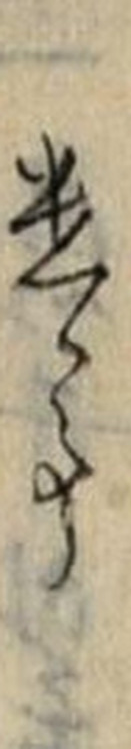遣候事
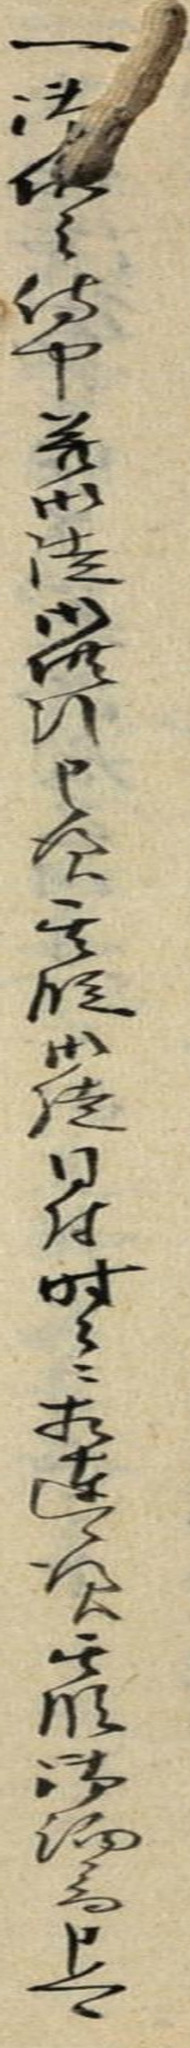一御供之侍中并御徒御供引申候得は其段御徒目付時々に相達候得は其段御泊にて申上候
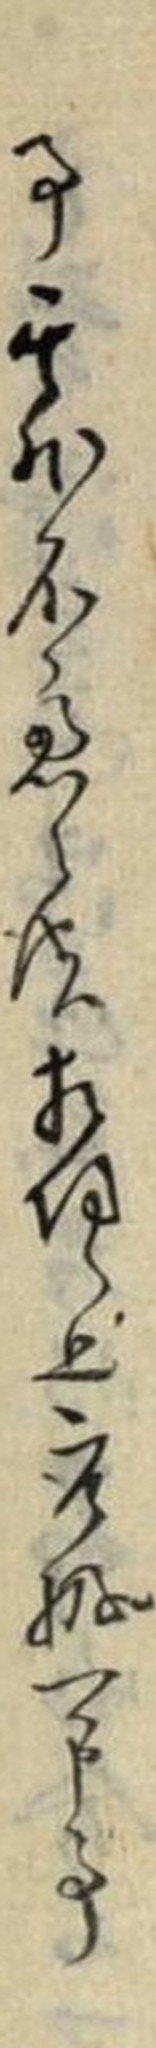事其外不慮之儀は相伺之上取扱可申事
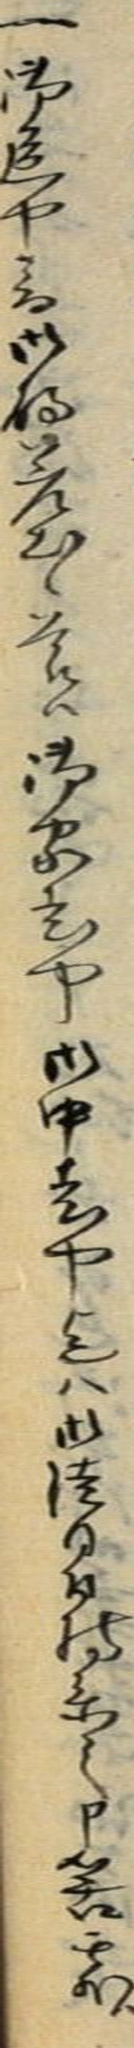一御道中にて御触差出候節は御家老中御中老中迄は御徒目付持参之申筈其外は
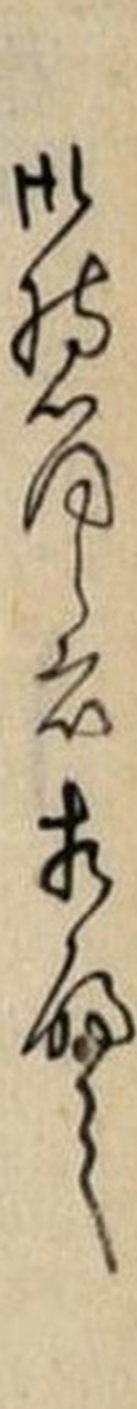御持筒之者相触之
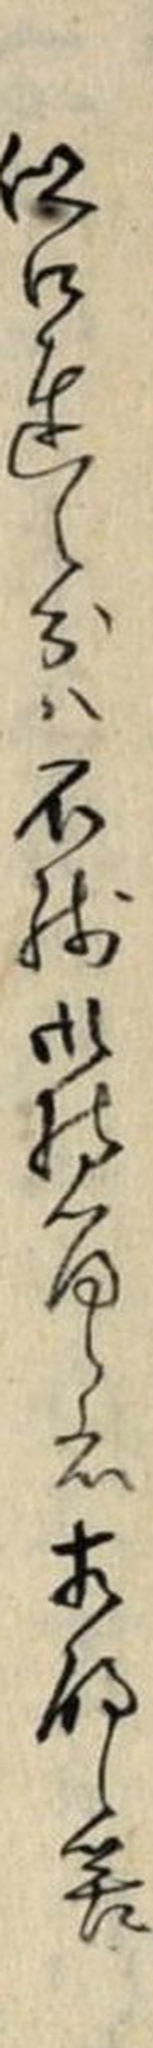但口達之分は不残御持筒之者相触候筈
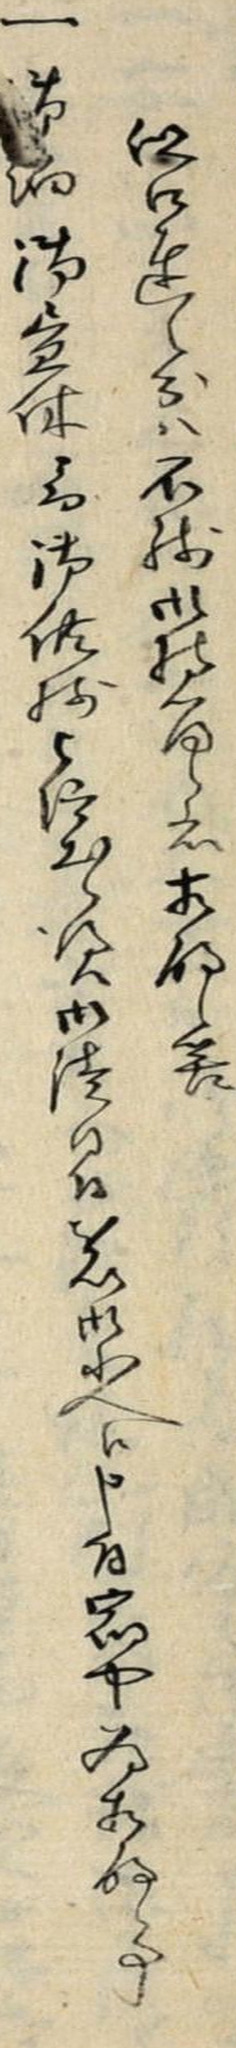一御泊御昼休にて御供揃被仰出候得は御徒目付を以御小人江申付宿中為相触事
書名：三都并道中之部
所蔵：福井県文書館 Fukui Prefectural Archives
